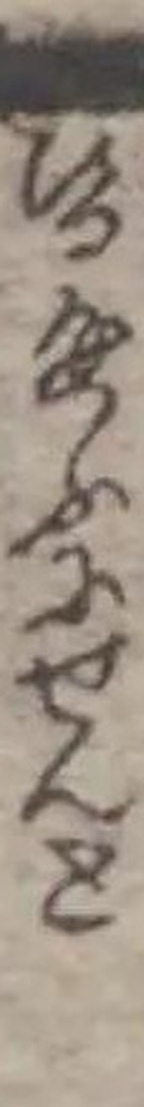皆通ふにせんと
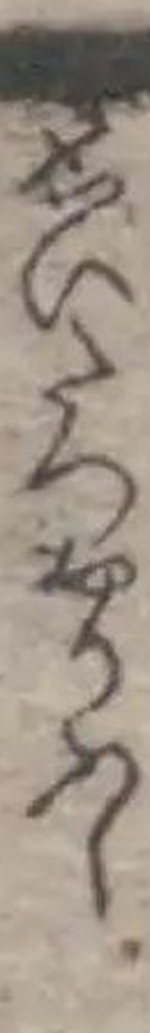思いたつおりふし
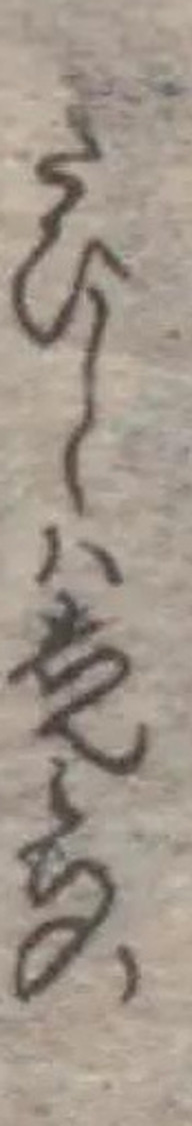さひしくはしんミちの
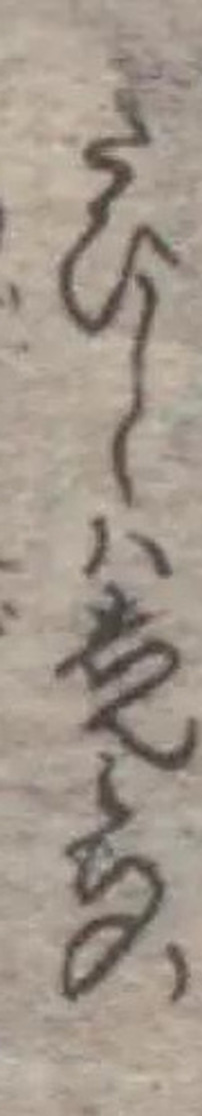さひしくはしんミちの
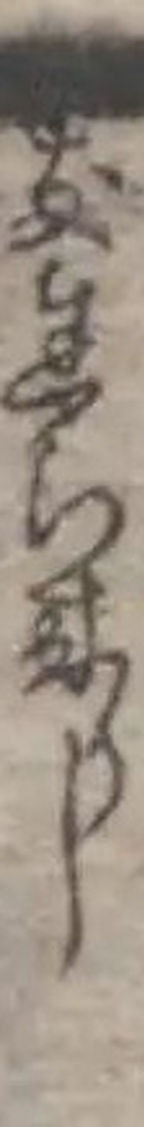友達ち来りし
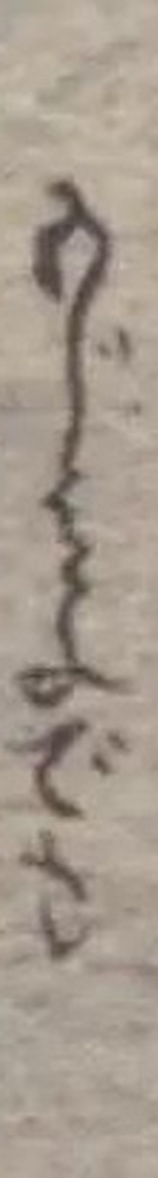もじよでも
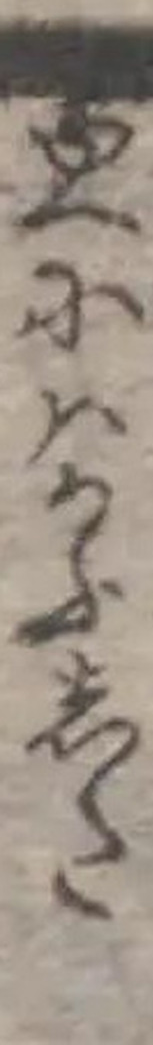ゆへにはかににした
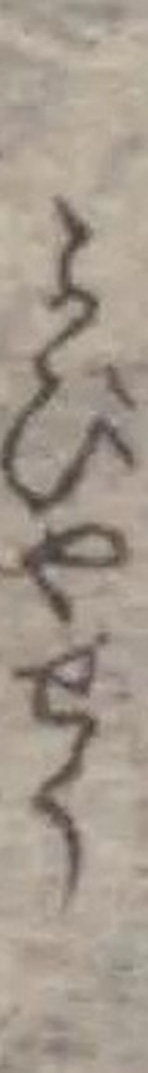よびやせう
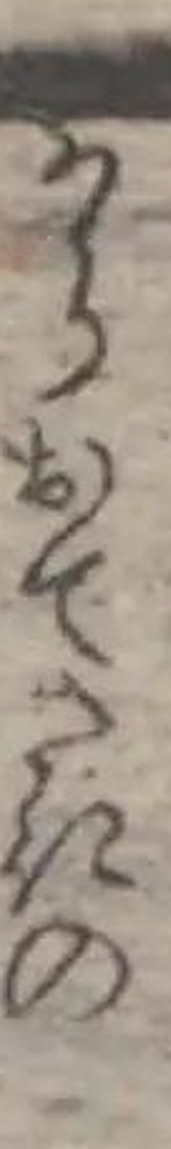からおてさきの
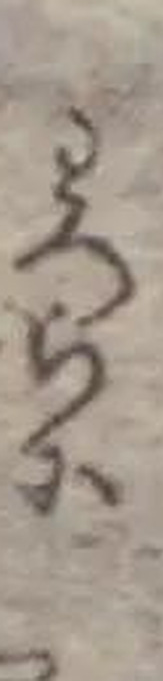わつちに
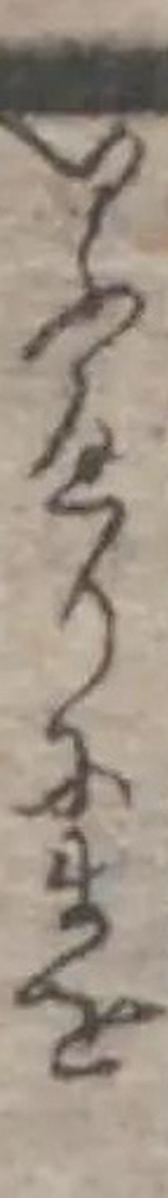いふ通りにまを
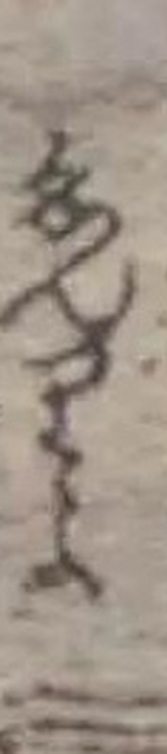ゑんりよ
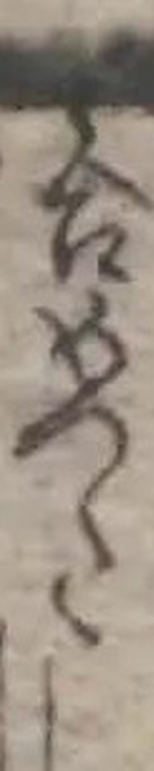合めつた
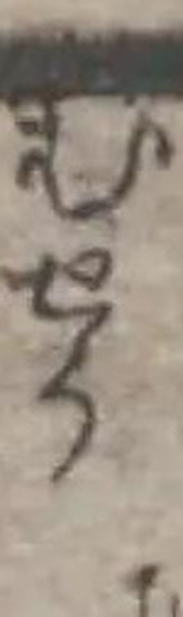むせう
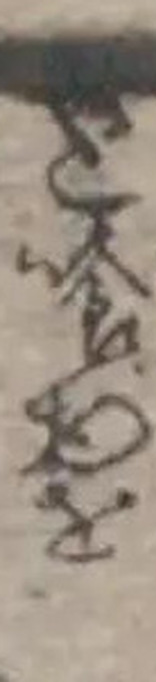と喰物を
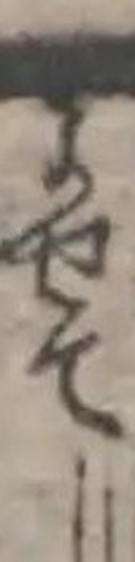よせて
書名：早出来 3巻
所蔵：国立国会図書館 National Diet Library, JAPAN
